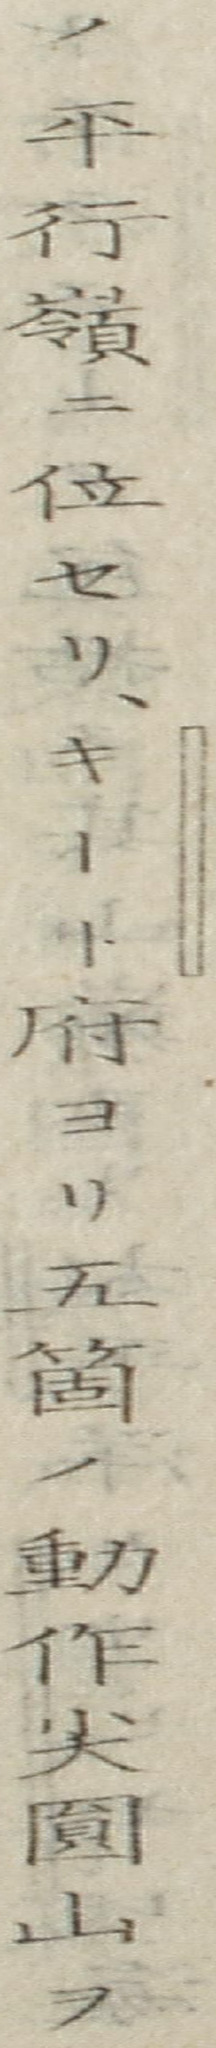ノ平行嶺ニ位セリ、キート府ヨリ五箇ノ動作尖圓山ヲ
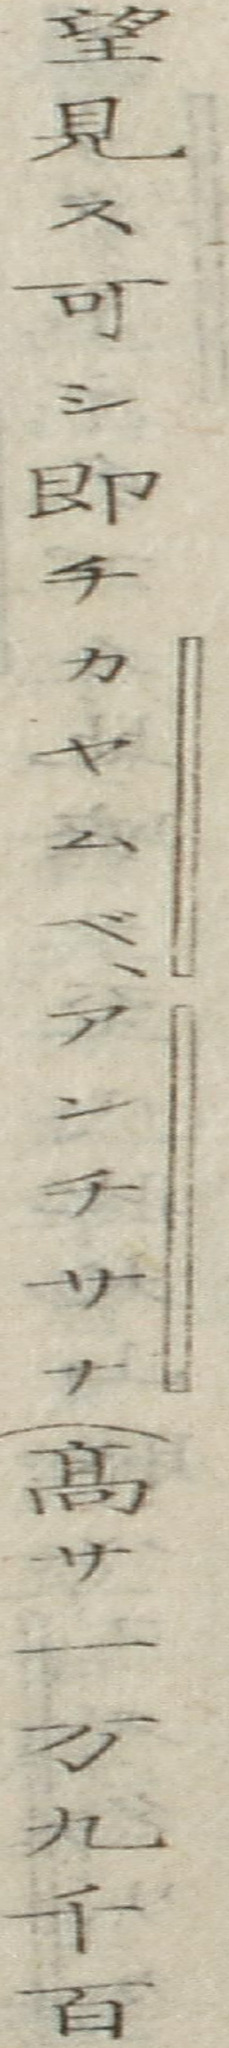望見ス可シ即チカヤムベ、アンチサナ（高サ一万九千百
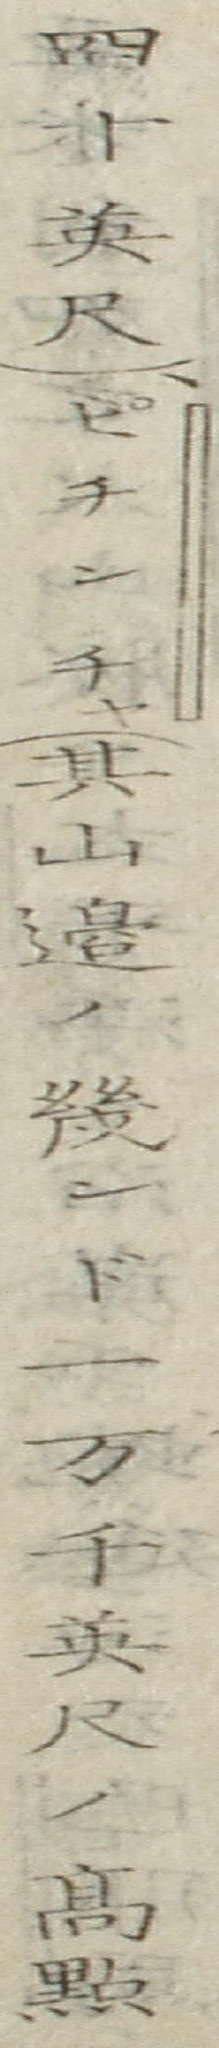四十英尺）、ピチンチャ（其山辺ノ幾ンド一万千英尺ノ高点
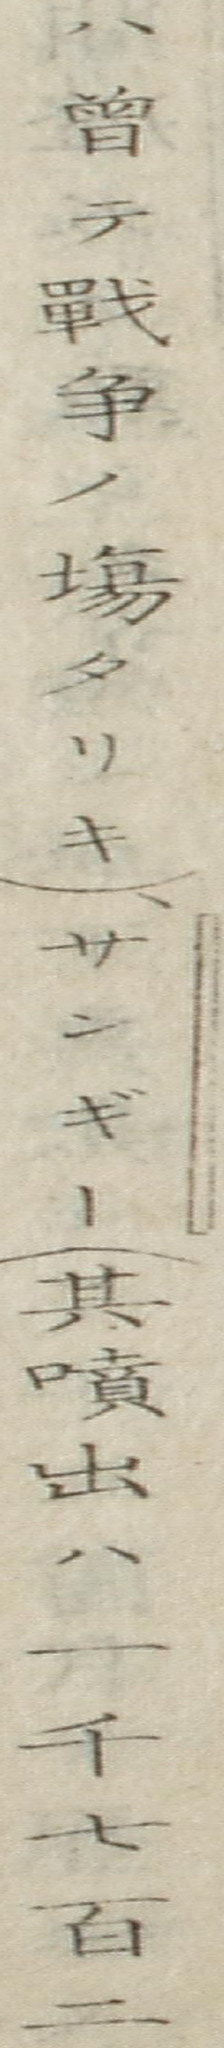ハ曽テ戦争ノ場タリキ）、サンギー（其噴出ハ一千七百二
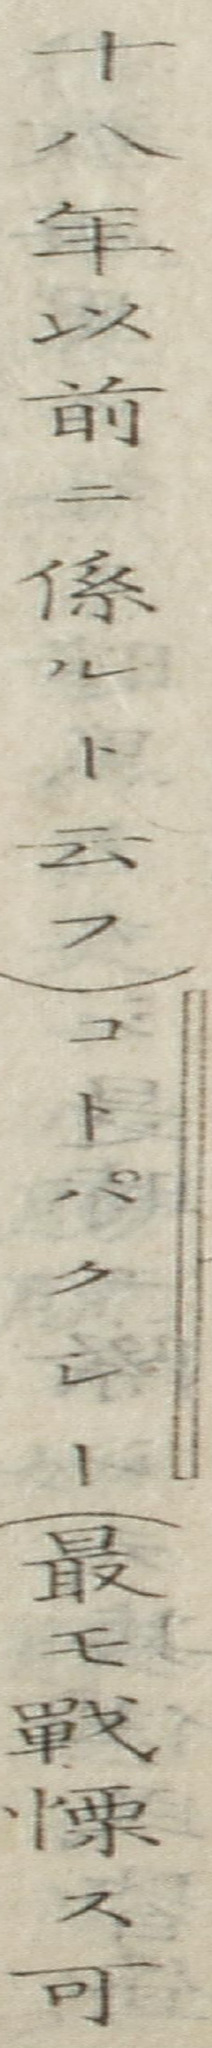十八年以前ニ係ルト云フ）コトパクシー（最モ戦慄ス可
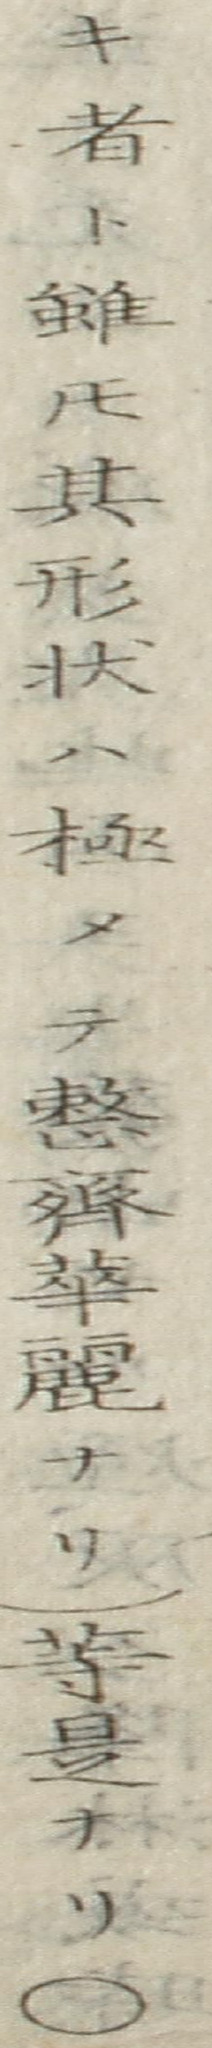キ者ト雖トモ其形状ハ極メテ整齊華麗ナリ）等是ナリ○
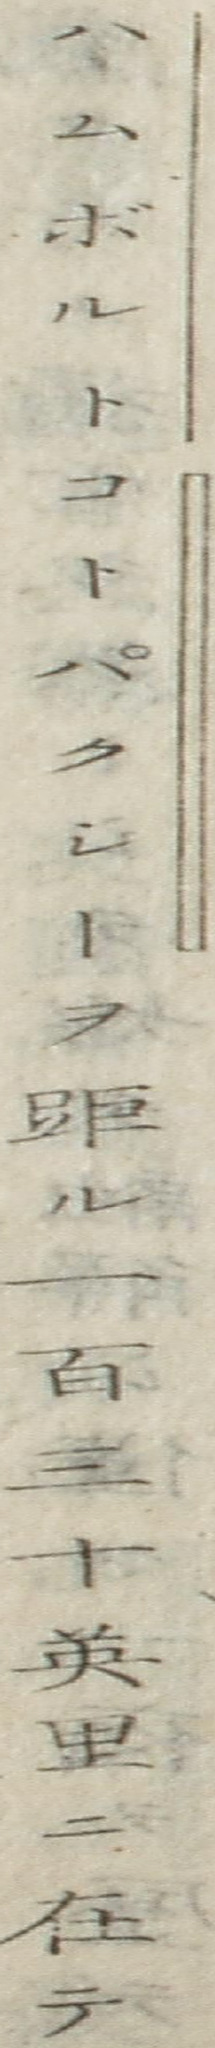ハムボルトコトパクシーヲ距ル一百三十英里ニ在テ
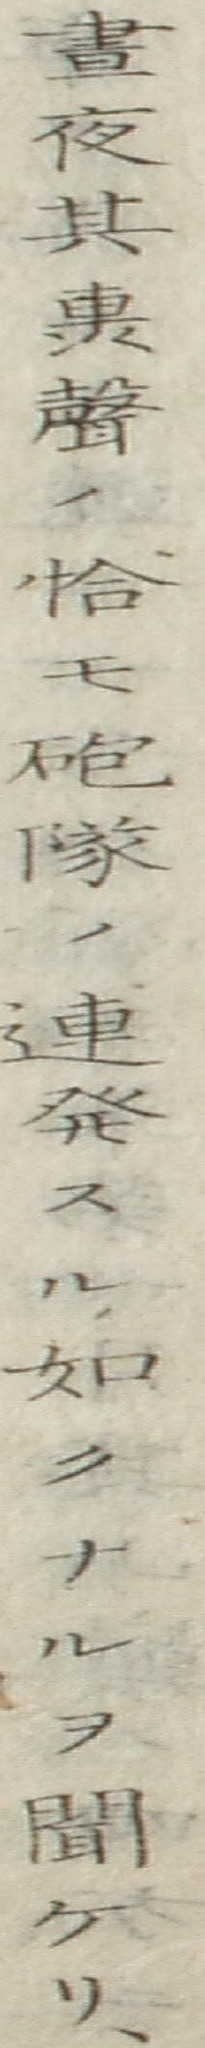昼夜其轟声ノ恰モ砲隊ノ連発スル如クナルヲ聞ケリ、
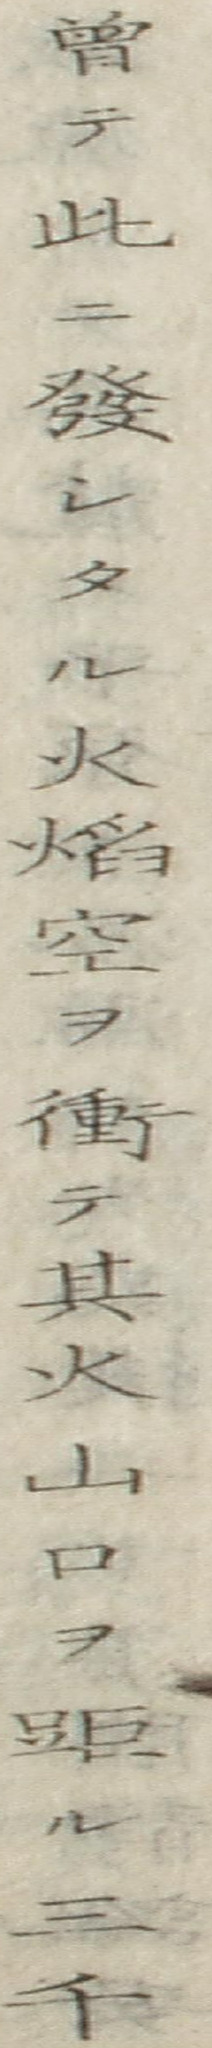曽テ此ニ発シタル火焔空ヲ衝テ其火山口ヲ距ル三千
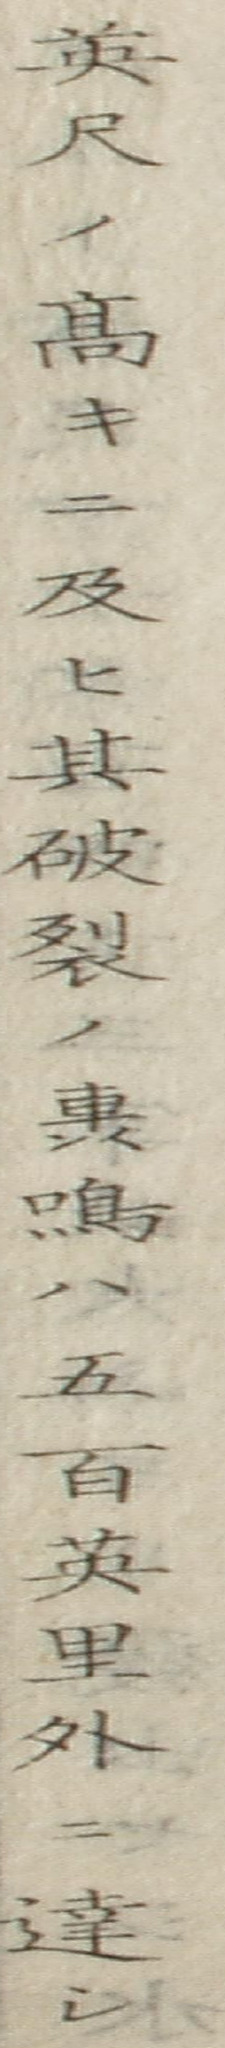英尺ノ高キニ及ヒ其破裂ノ轟鳴ハ五百英里外ニ達シ

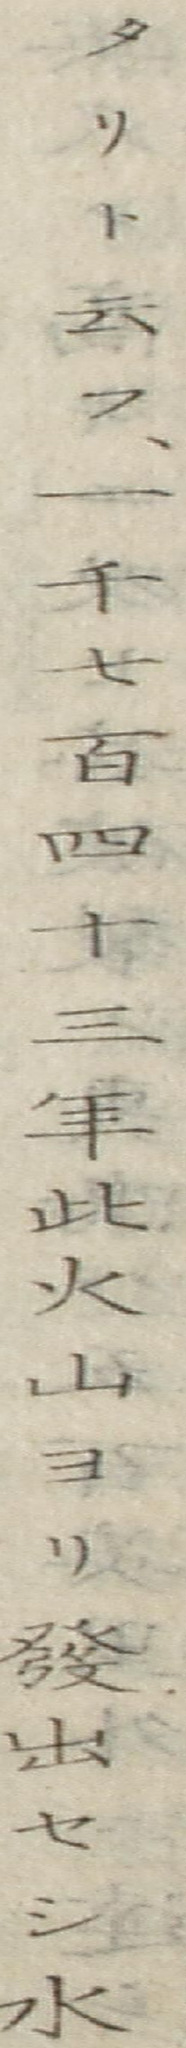タリト云フ、一千七百四十三年此火山ヨリ発出セシ水
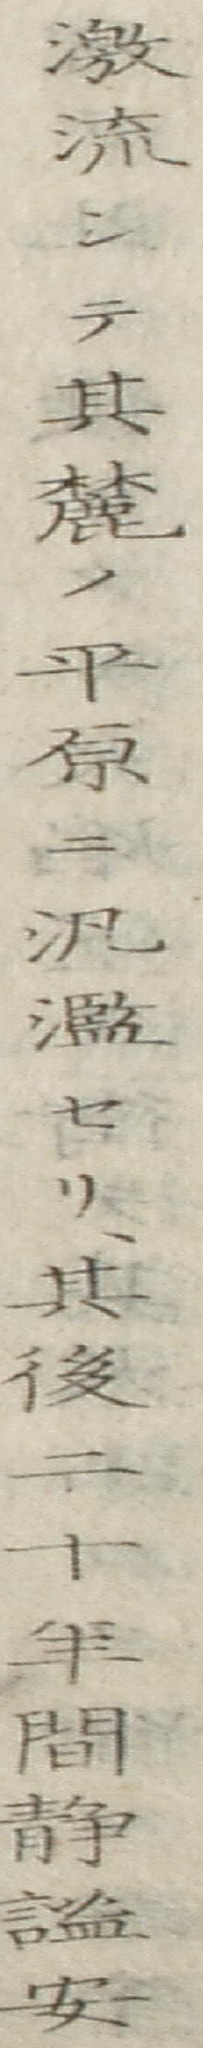激流シテ其麓ノ平原ニ氾濫セリ、其後二十年間静謐安
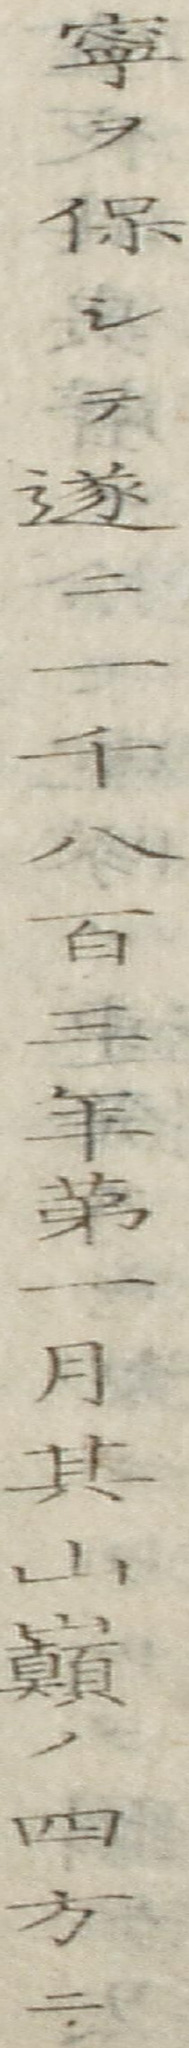寧ヲ保シテ遂ニ一千八百三年第一月其山嶺ノ四方ニ
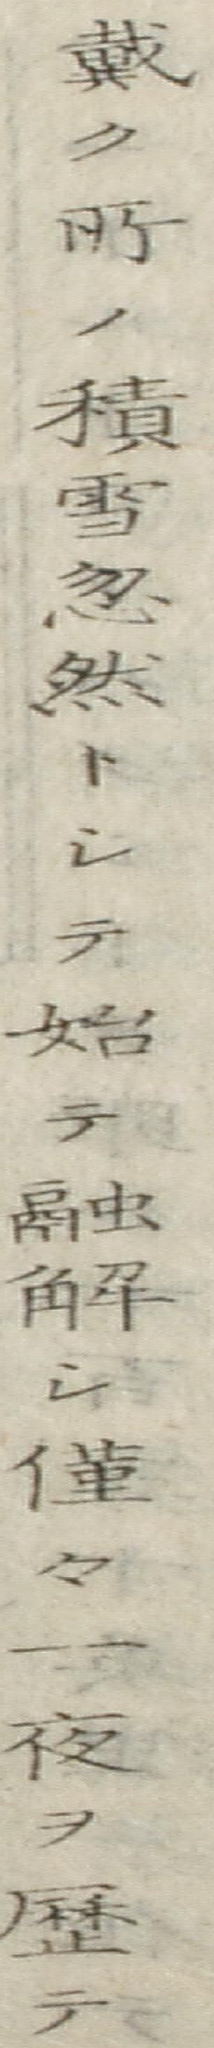戴ク所ノ積雪忽然トシテ始融解シ僅々一夜ヲ歴テ
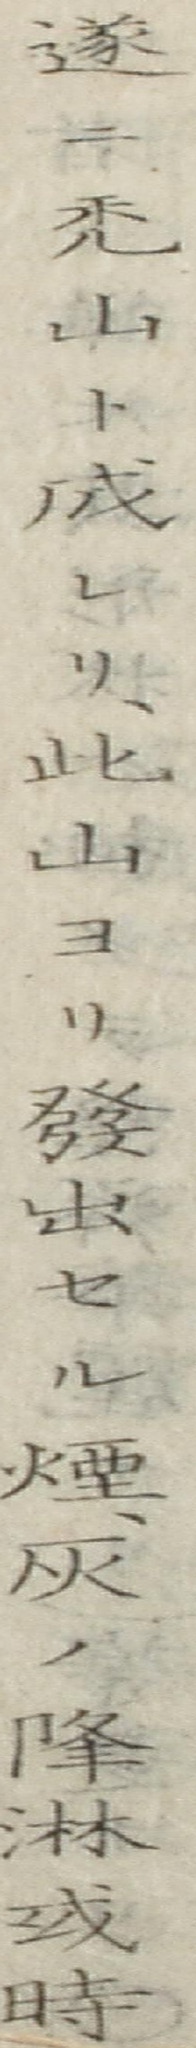遂ニ禿山ト成レリ、此山ヨリ発出セル煙、灰ノ降淋或
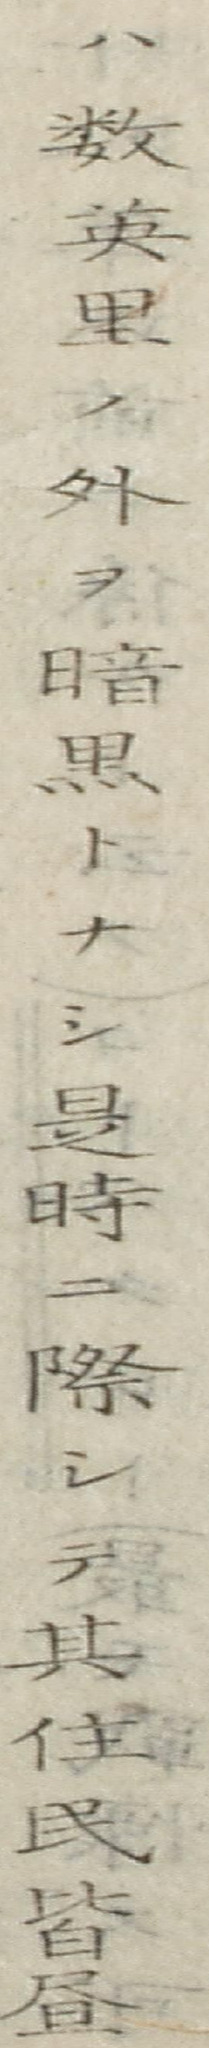ハ数英里ノ外ヲ暗黒トナシ是時ニ際シテ其住民皆昼
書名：地形論　巻二
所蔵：東京大学地震研究所図書室 Earthquake Research Institute Library, The University of Tokyo, JAPAN
